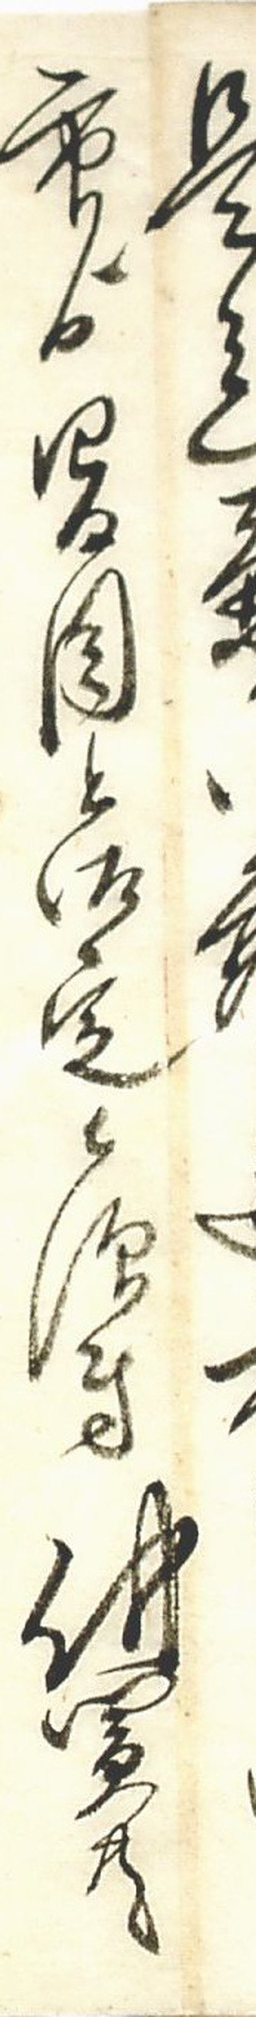市ゟ四日目と御定被仰付仲買共
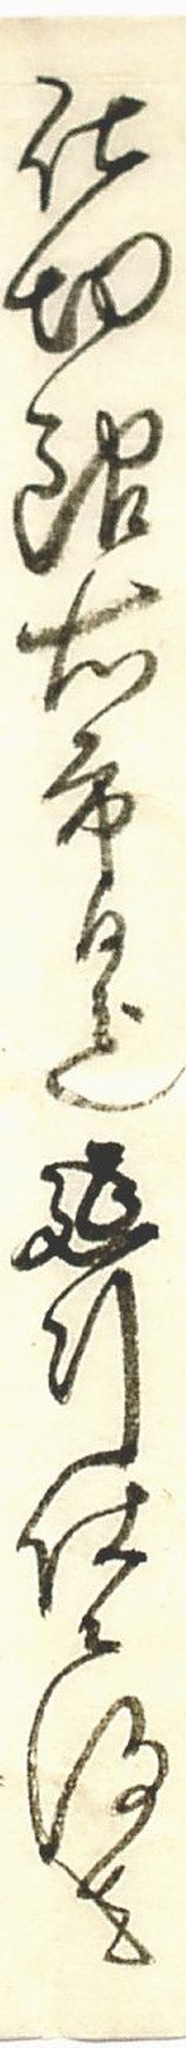仕切銀右市日迄延引仕候得は
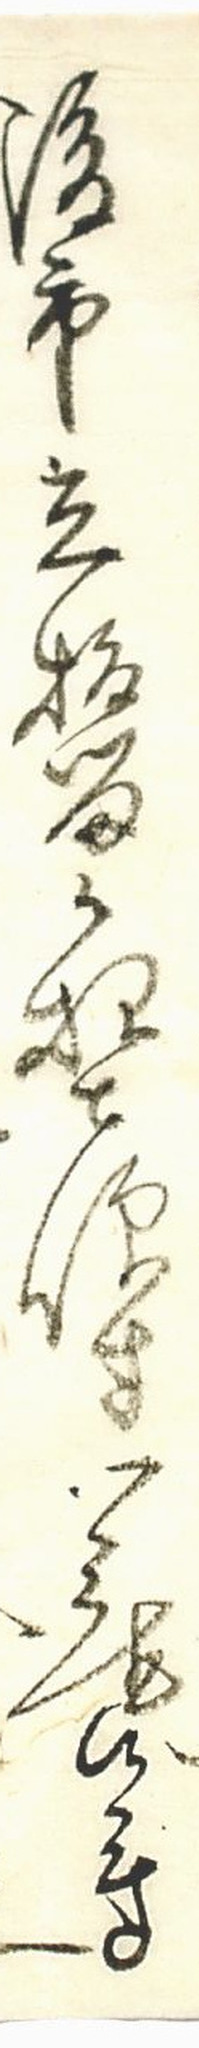後市立指留候様被仰付御座候に付
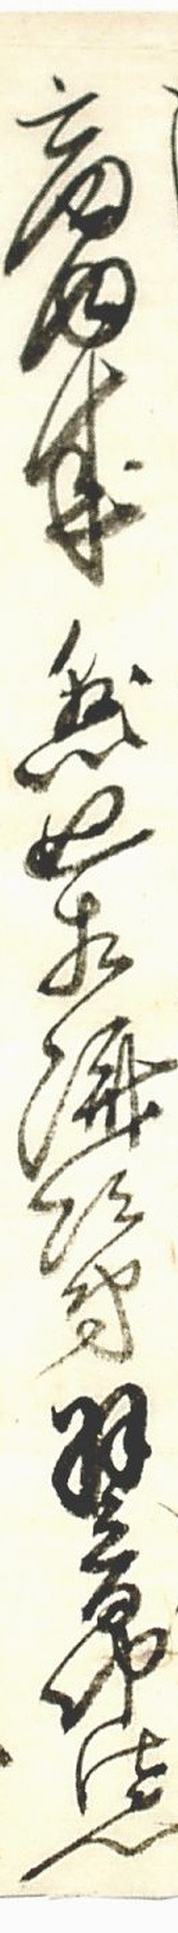商内成懸廻相済次第翌日仲仕を以
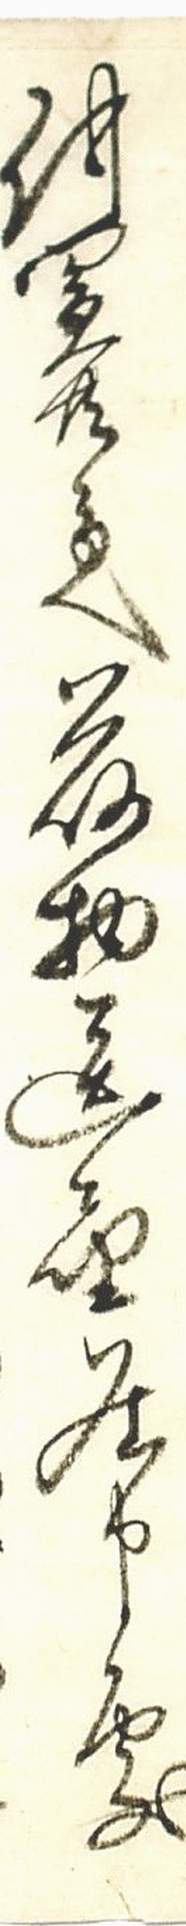仲買共方へ荷物送届居申処
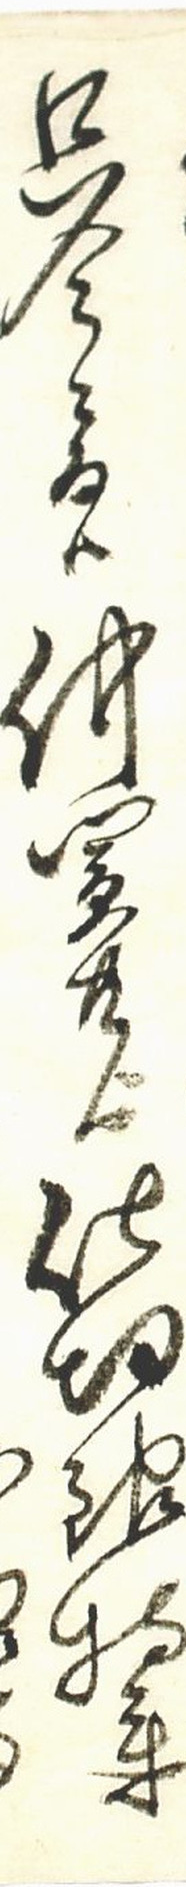只今にては仲買共ゟ仕切銀持来
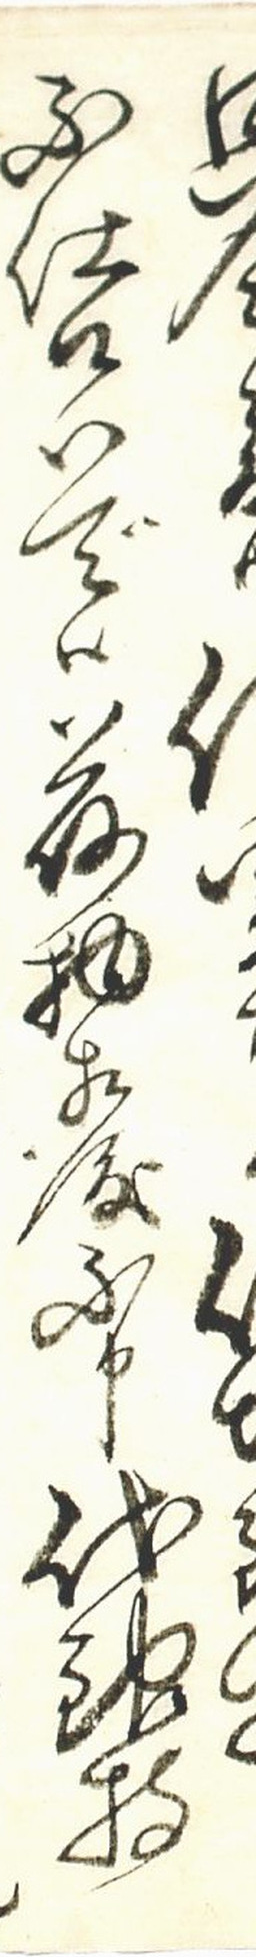不仕候はでは荷物相渡不申代銀持
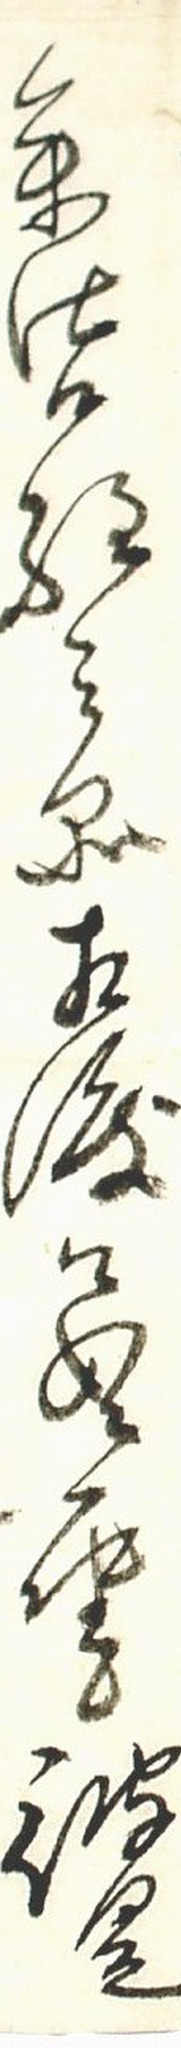来仕候程之品相渡候義に御座候彼是
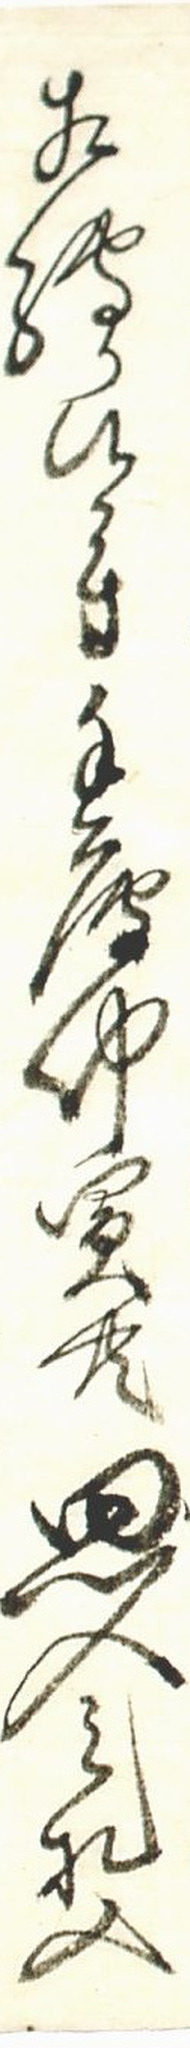相伝り候に付手広仲買共思入之札入
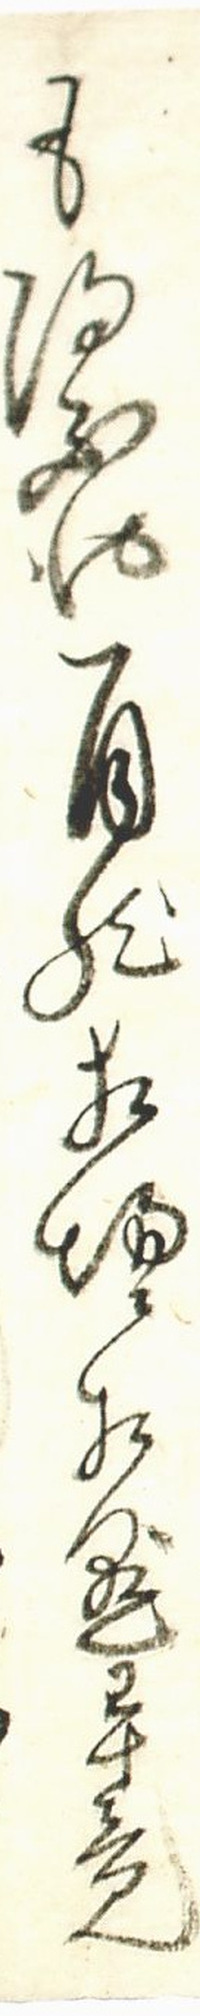も得不仕自然相場に相懸畢竟
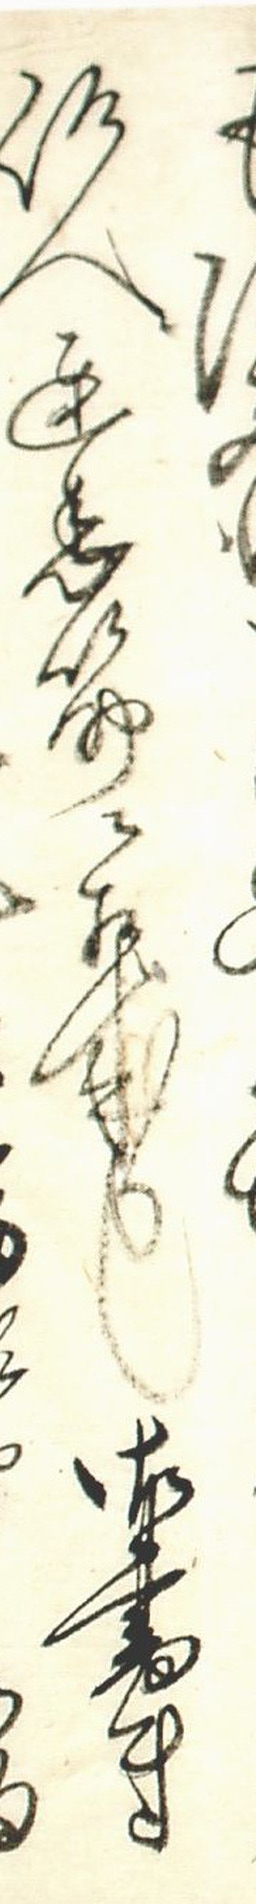作人迷惑筋に相成申候御書付
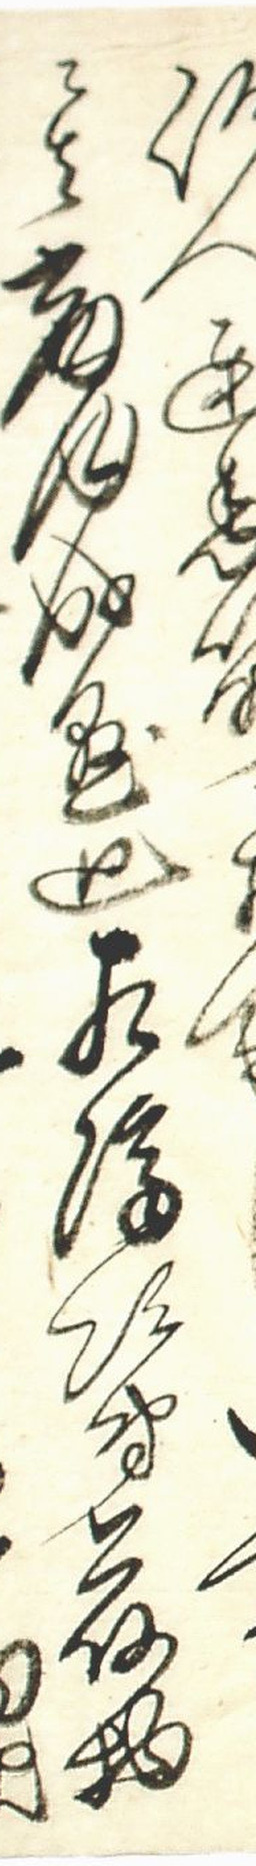には商内成懸廻相済次第荷物
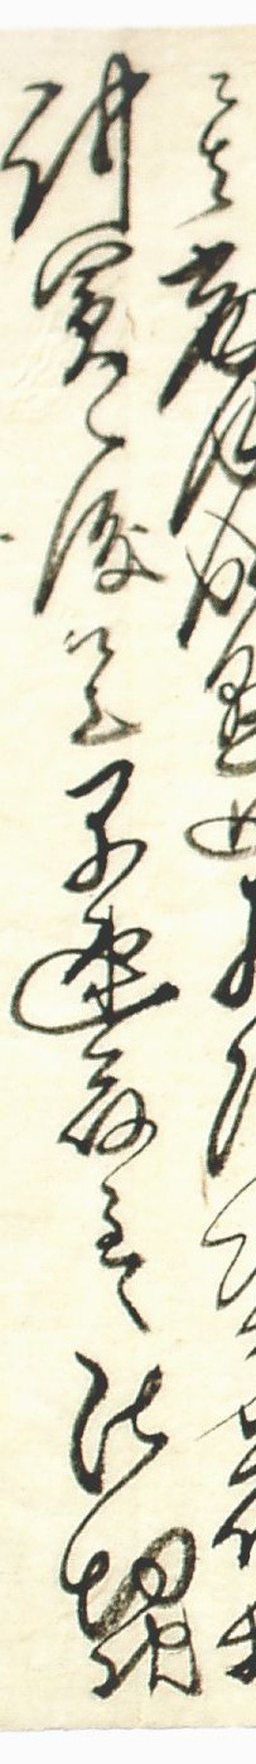仲買へ渡候上早速荷主へ仕切銀
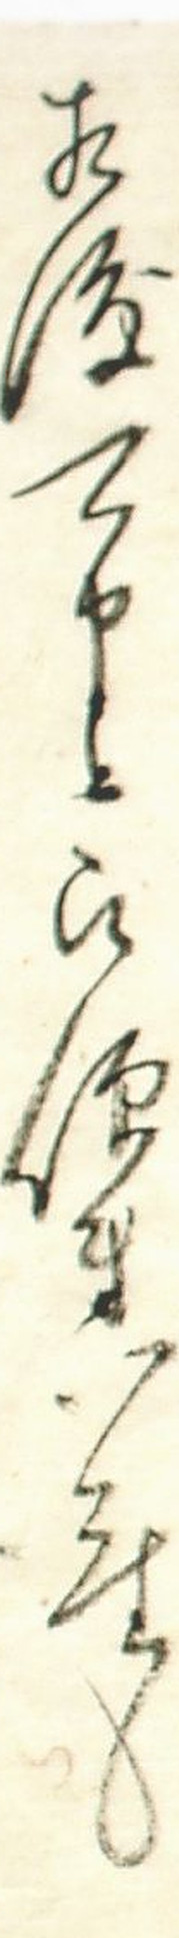相渡可申と被仰付御座候

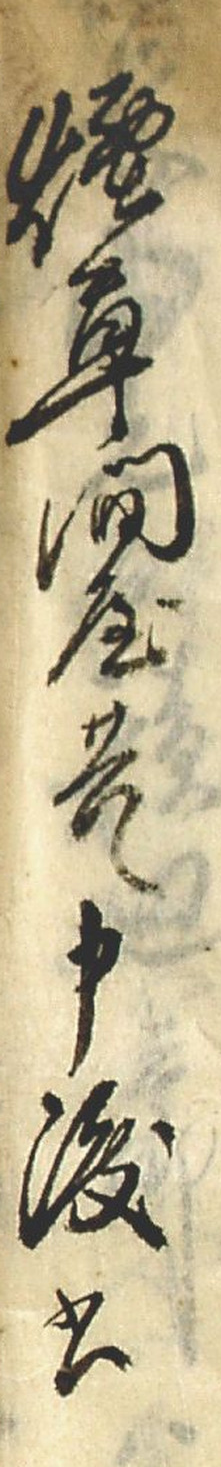煙草問屋共へ申渡書
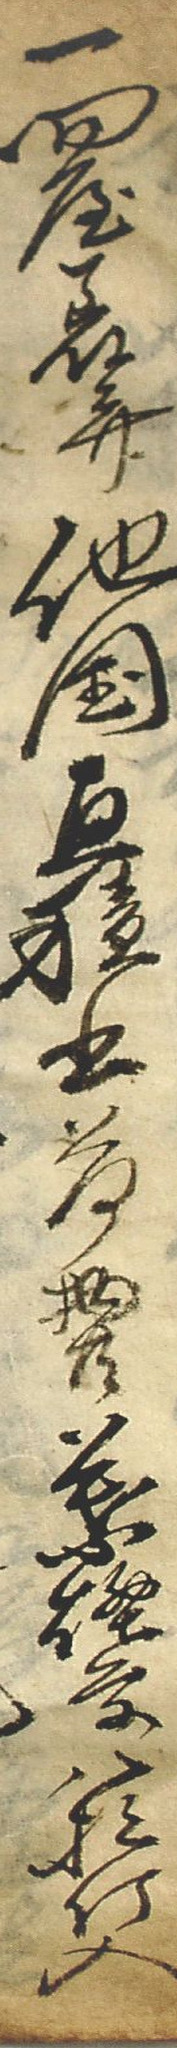一問屋着并他国直積出荷物共葉煙草八拾斤入
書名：煙草問屋扱方一件他
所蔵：鳴門教育大学 Naruto University of Education
